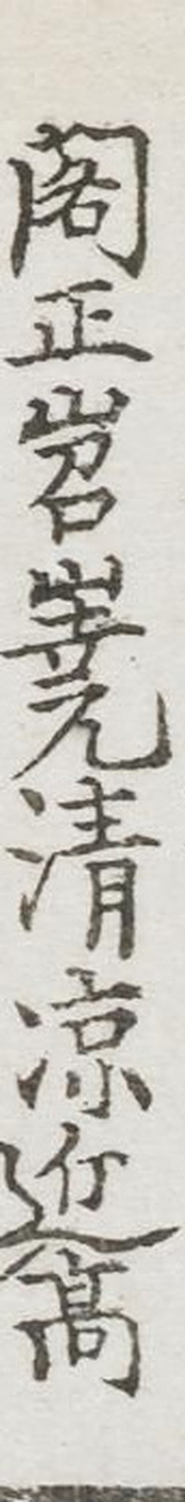閣正岧嶢清涼近高
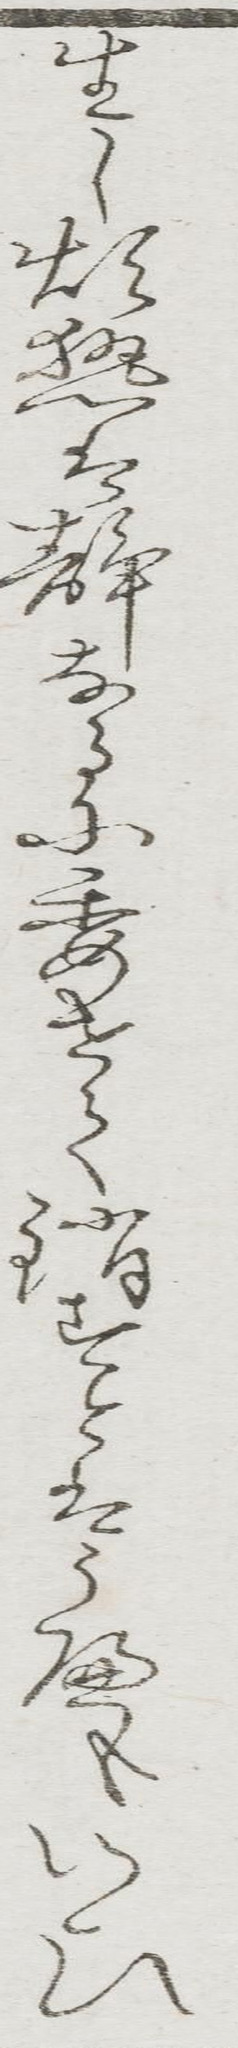生し煩熱は静なるに委せて銷すとはうへもいひ
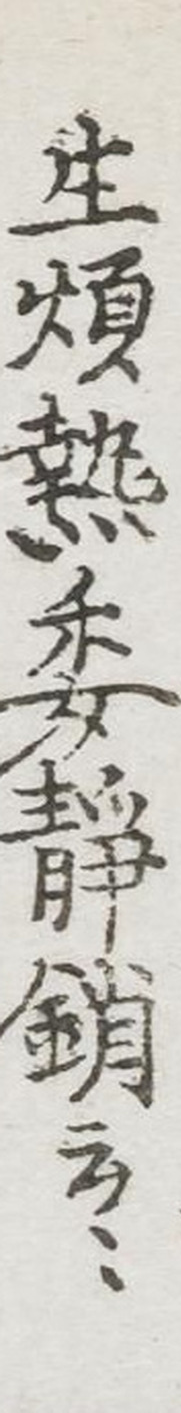生煩熱委静銷云々
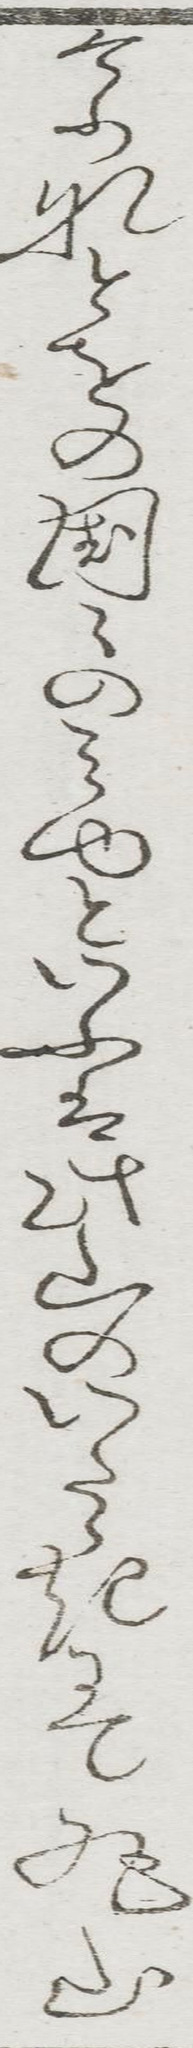けりなとをの国々のみゆといふは此山のいたゝきにて丸山
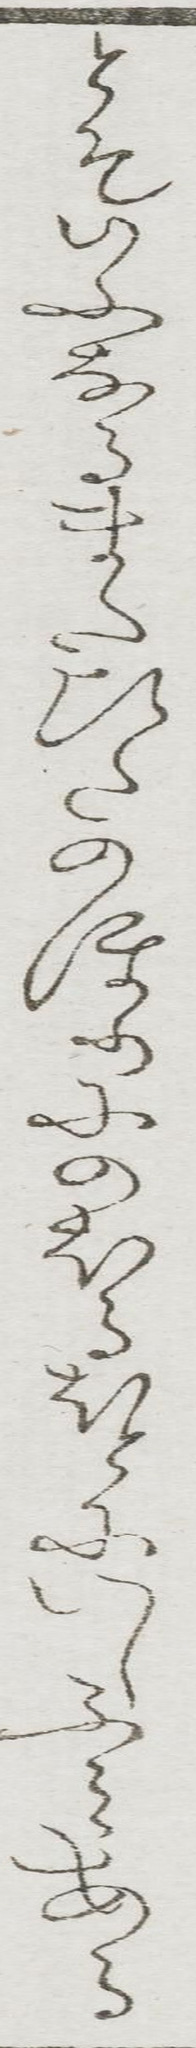とそいふなるまたひたのほりにのほるほとにいしふみある
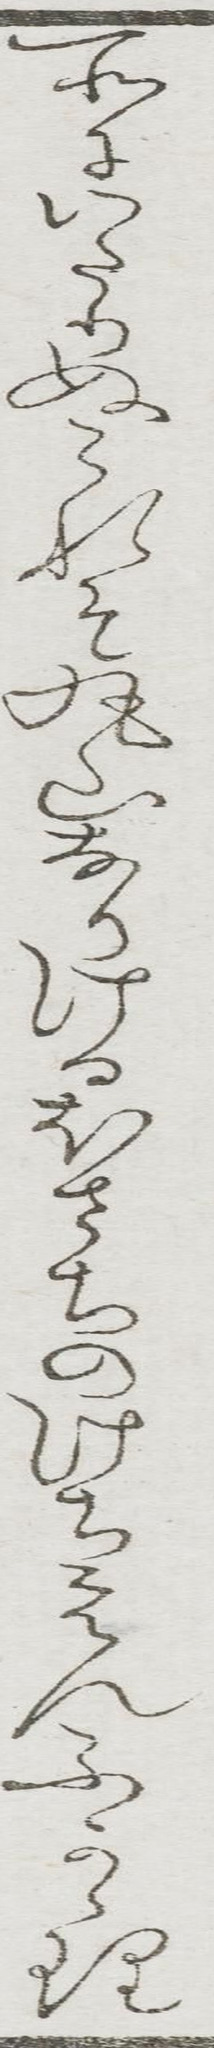所にいたりぬこれそ丸山なりけるほさちのけちえんふかゝり
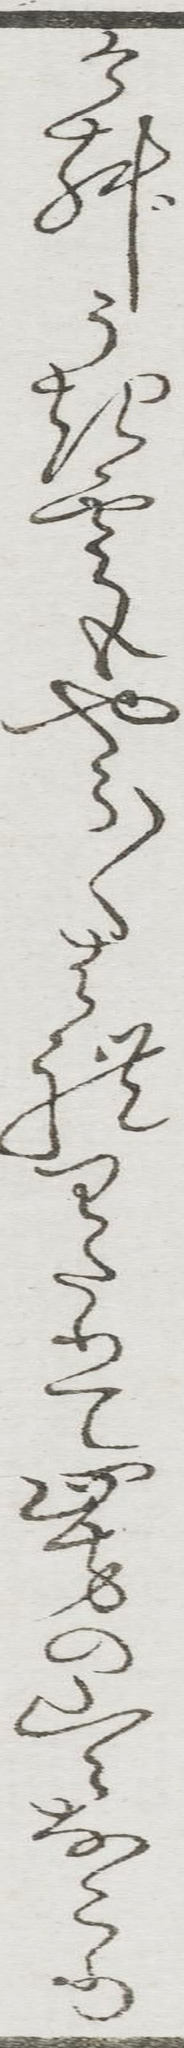けむうき雲もやう〳〵はれわたりて四方の山々なこり
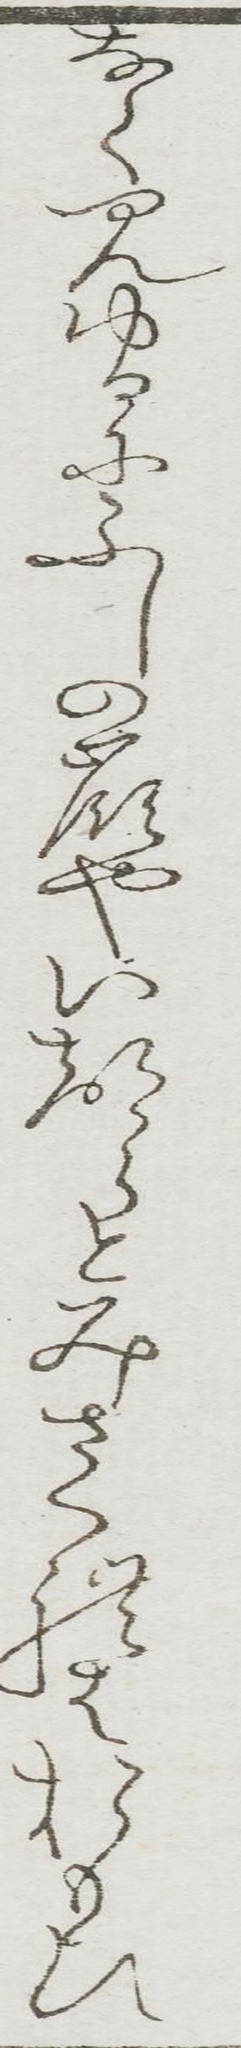なく見ゆるにふしの嶺やいつらとみさくれはおもひ
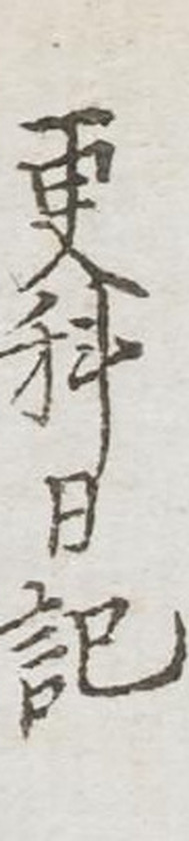更級日記
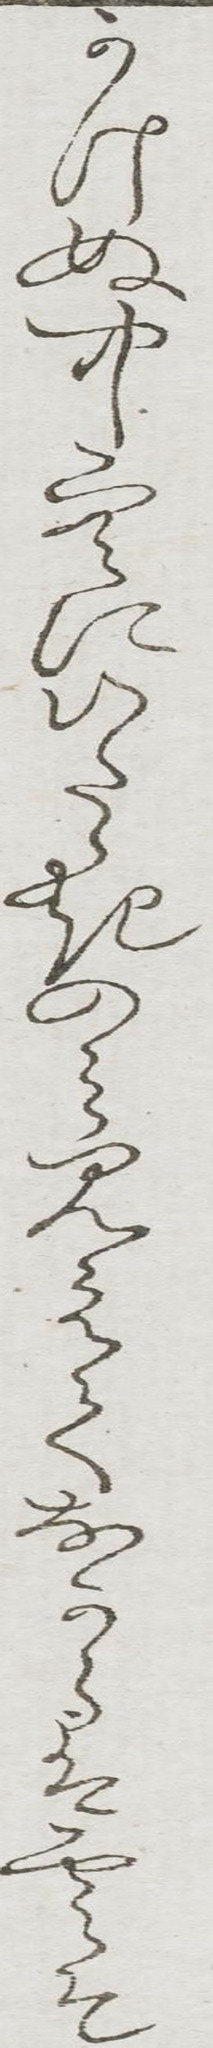かけぬ中空にいたゝきのみ見えてなかるは雲そ
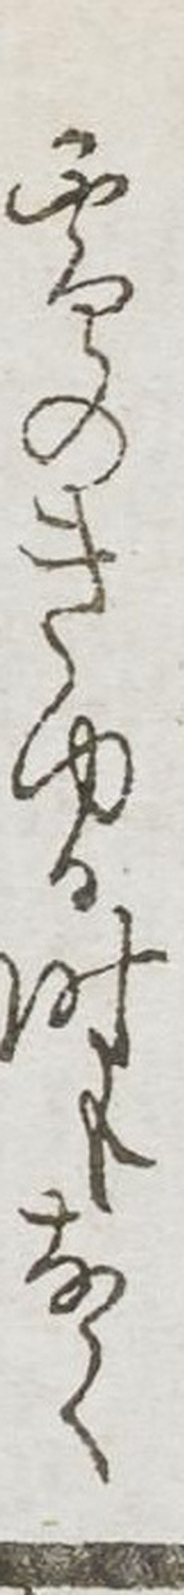雪のきゆる時もなく
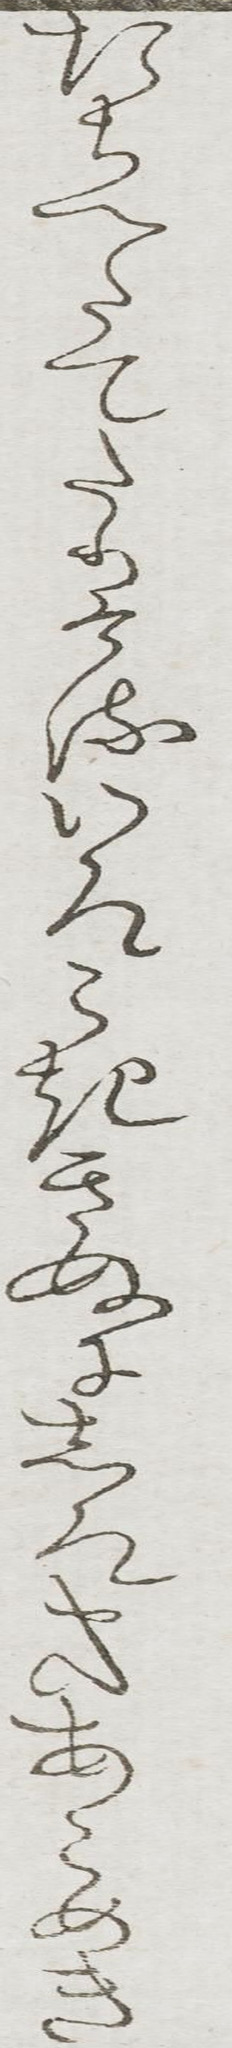たちへたてたりけるいろこきこぬにしろきあこめき
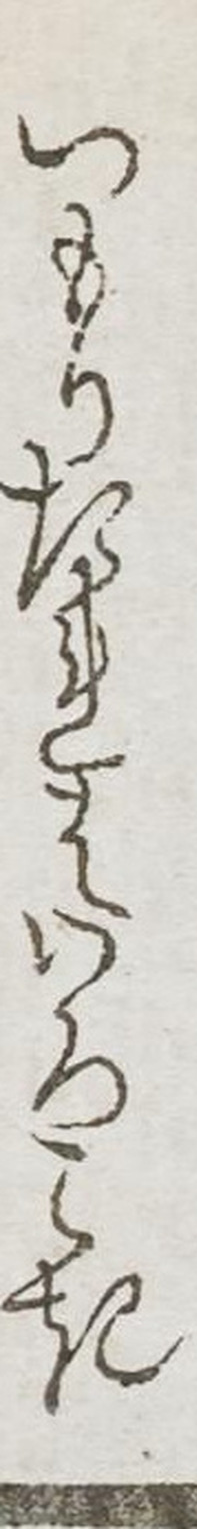つもりたれはいろこき
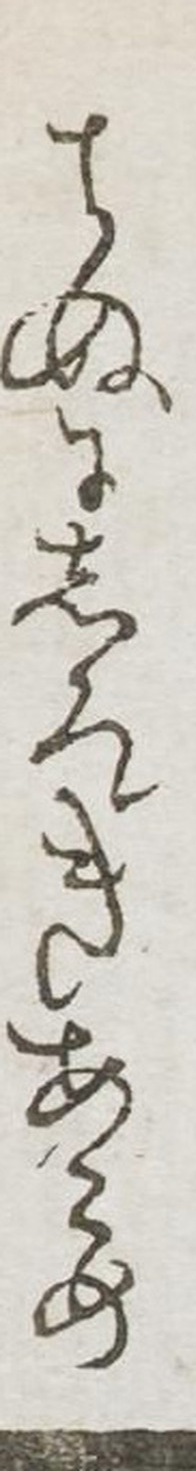ちぬにしろきあこめ
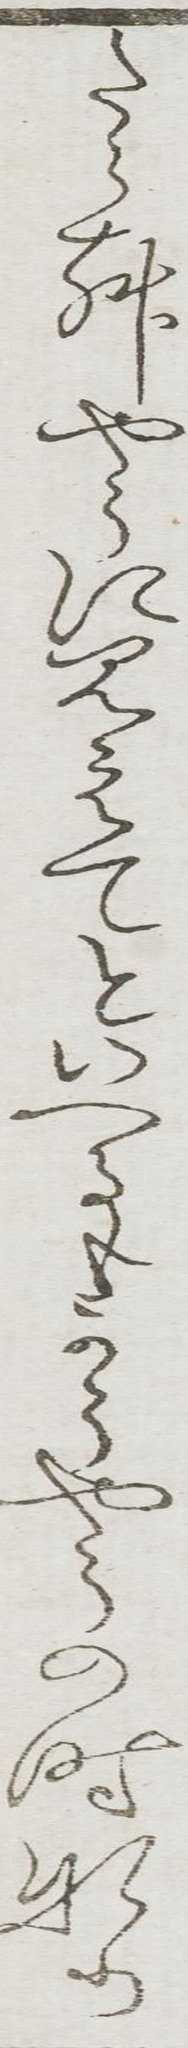たらむやうに見えてといへるもかうやうの時なり

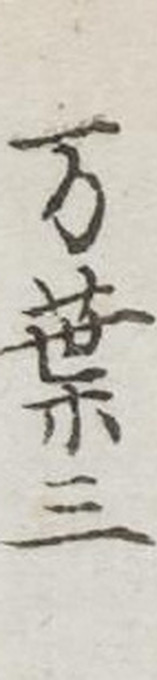万葉三
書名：挿画熱海日記　全
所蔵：東京大学地震研究所図書室 Earthquake Research Institute Library, The University of Tokyo, JAPAN
